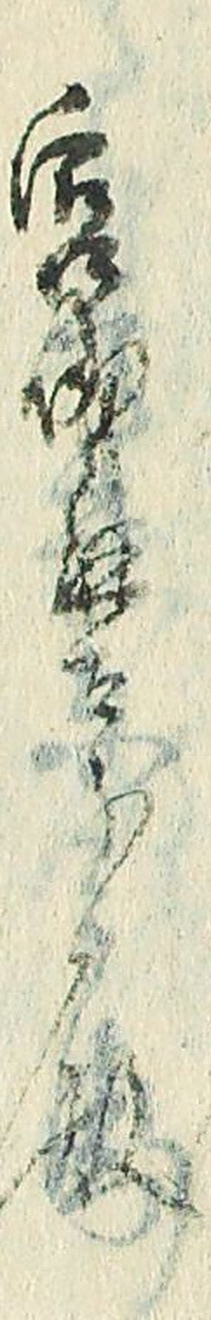宮城麻太郎殿
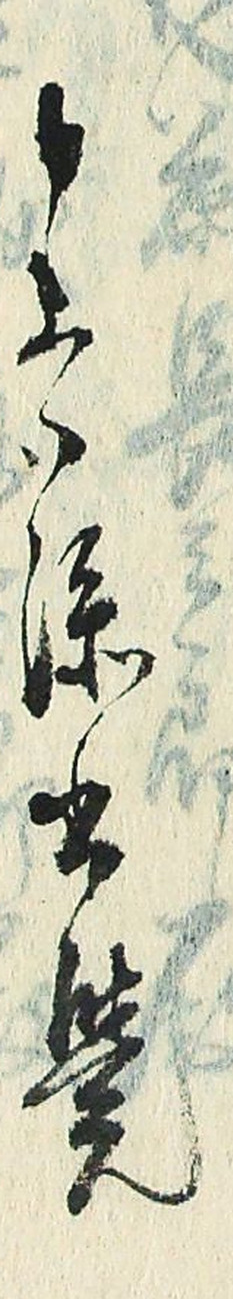申上御添書覚
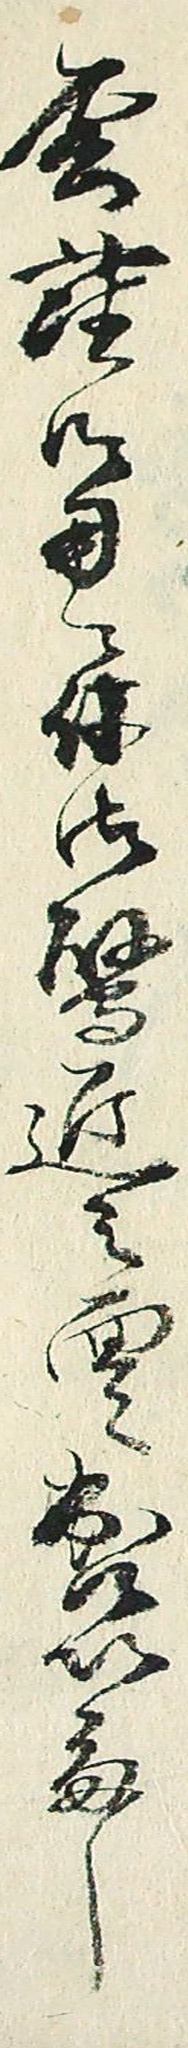雲雀御用に付御鷹匠之面々出郷いたし

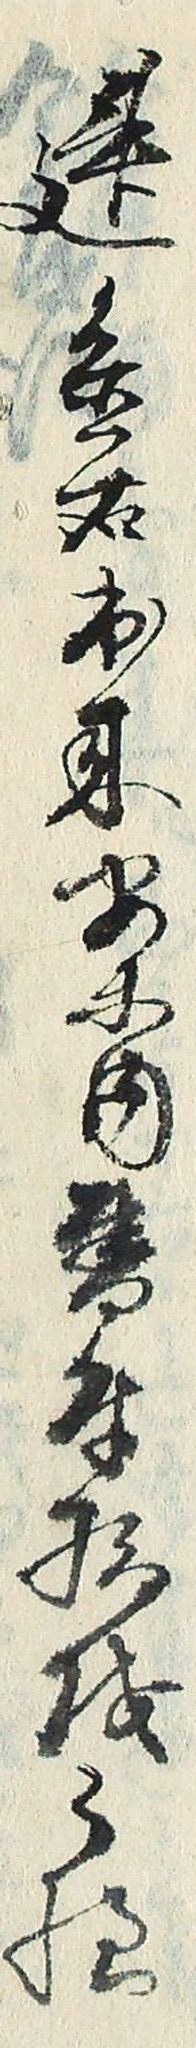建置右出来案内書付指越候様
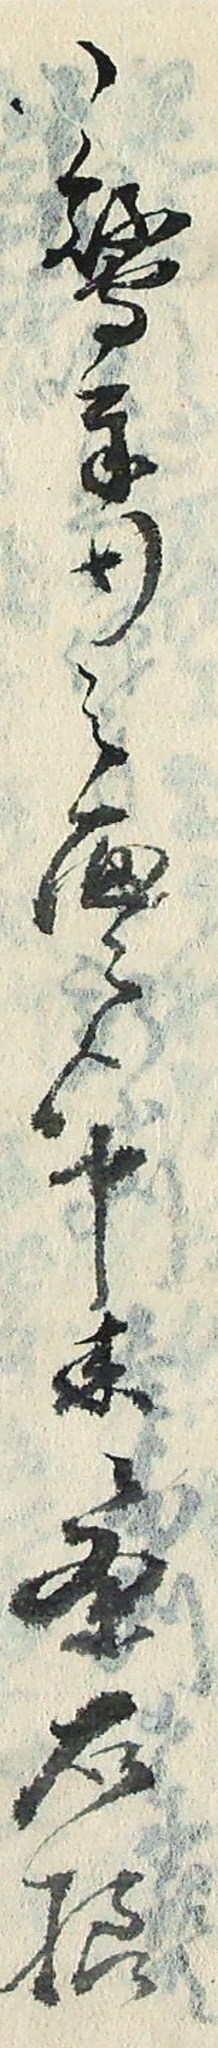御鷹奉行之面々ゟ申来候条右様
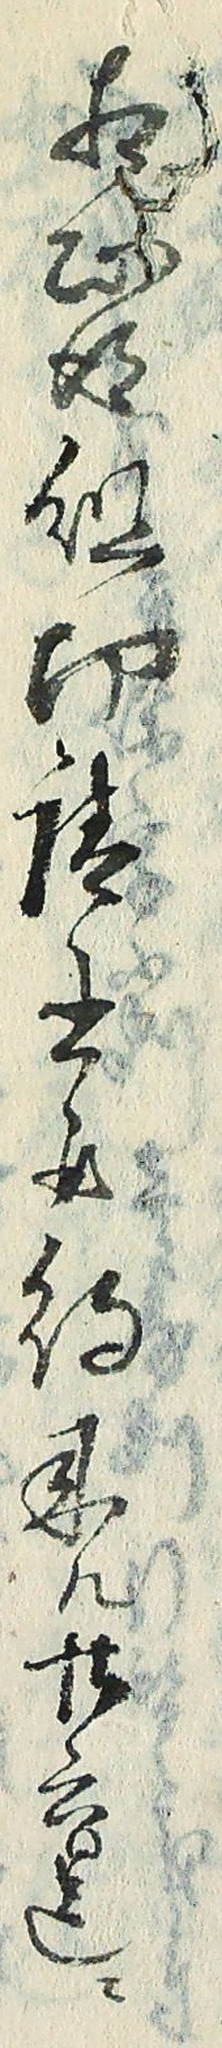相心得組切受書取都来る廿六日迄に
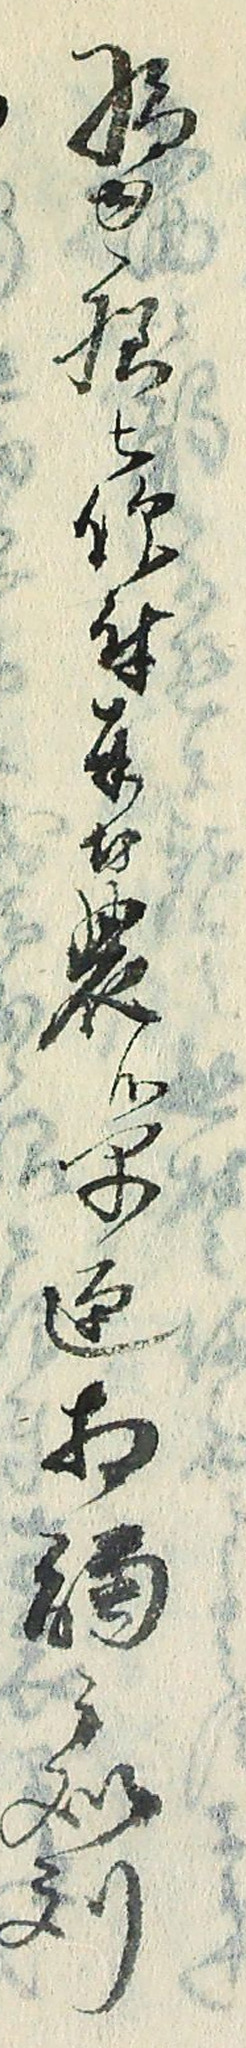指出候様被仰付奉畏候早速相触候処別
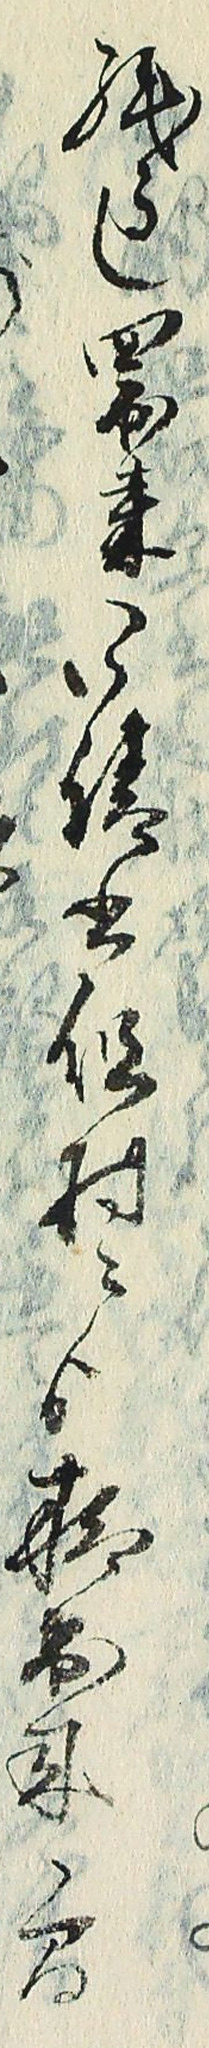紙通出来候御請書組村々ゟ指出来候間
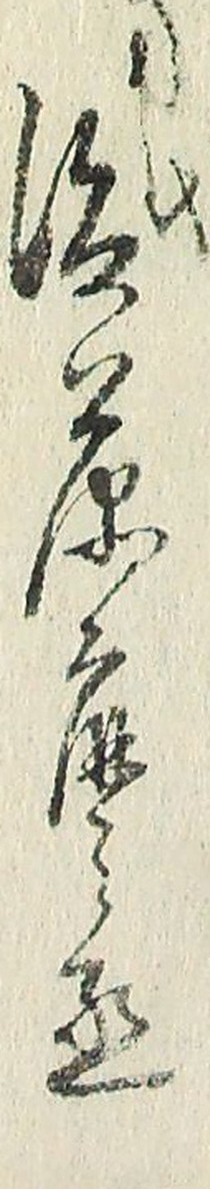後藤麻之丞
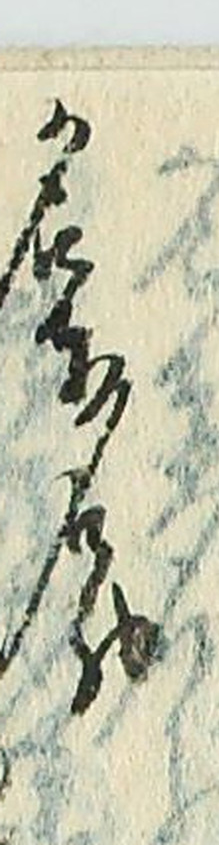名東名西
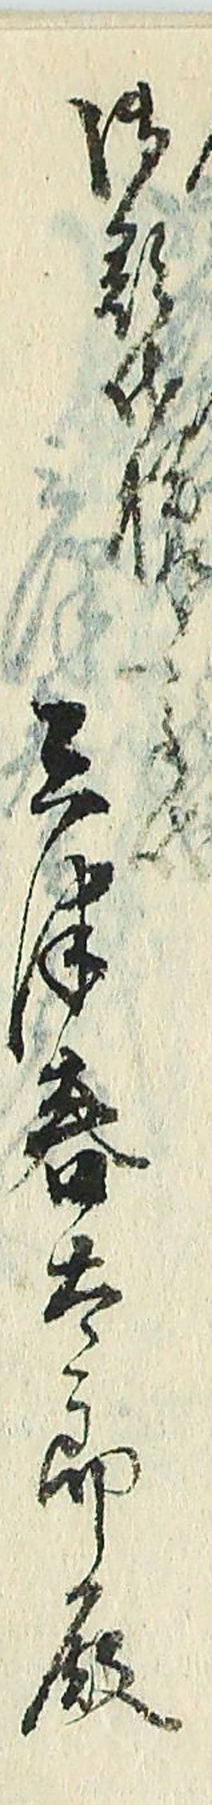三沢春太郎殿
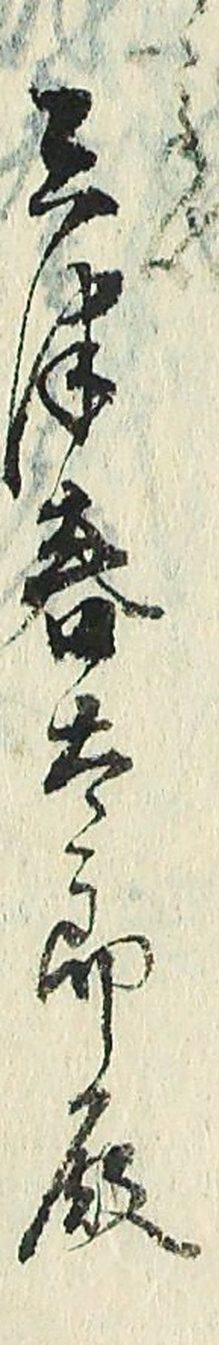三沢春太郎殿
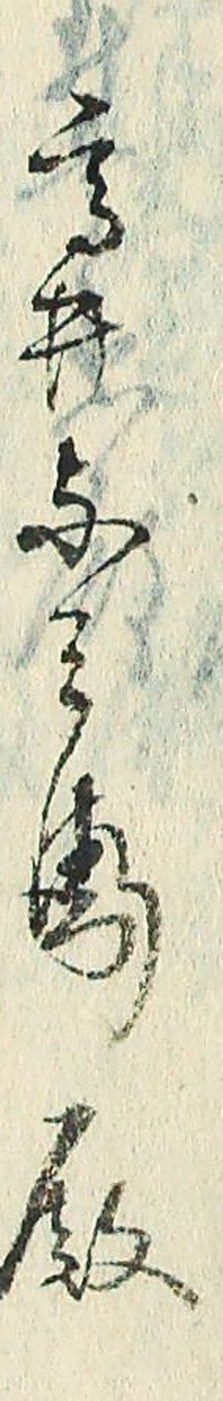高井与三兵衛殿
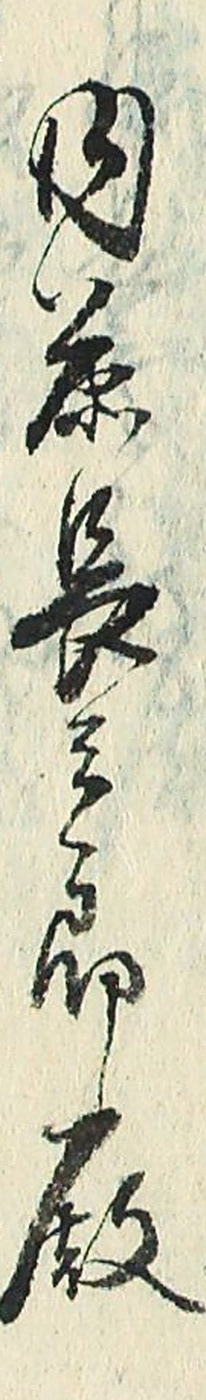内藤長三郎殿
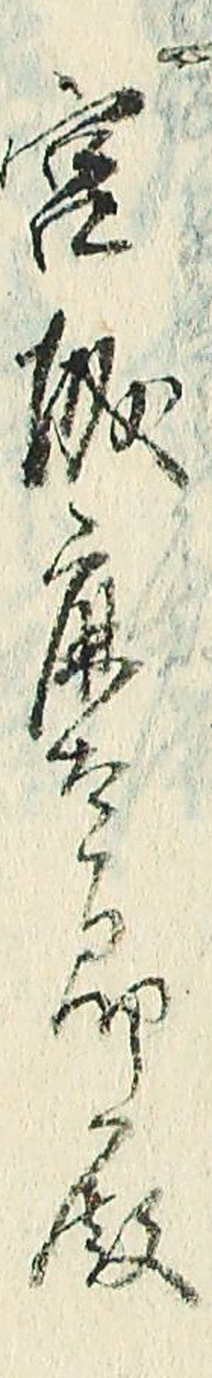宮城麻太郎殿

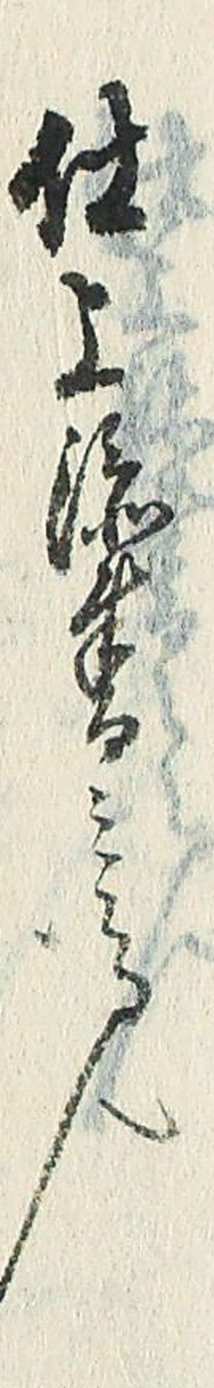申上添書之覚
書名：諸御用御□受書控
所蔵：鳴門教育大学 Naruto University of Education
